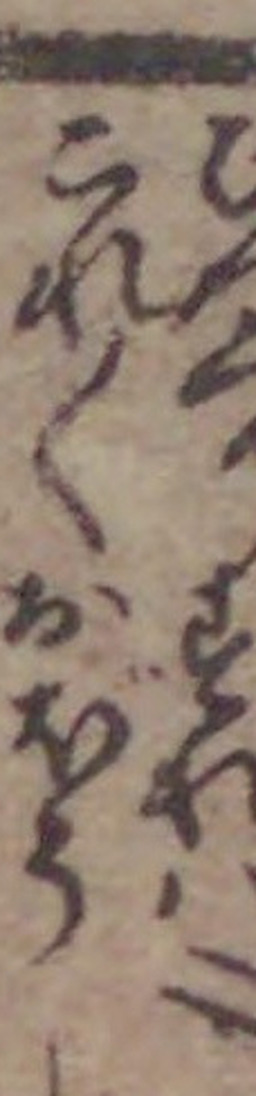これ〳〵おぼう
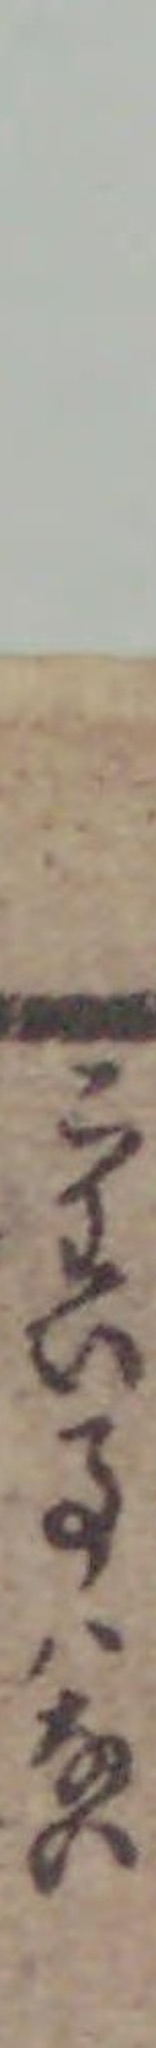こわい事はない
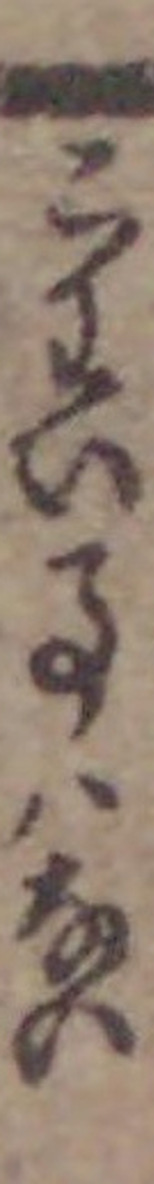こわい事はない
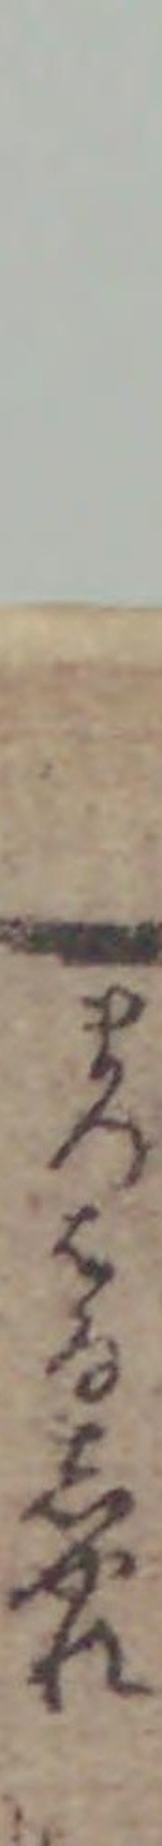まつはなしやれ
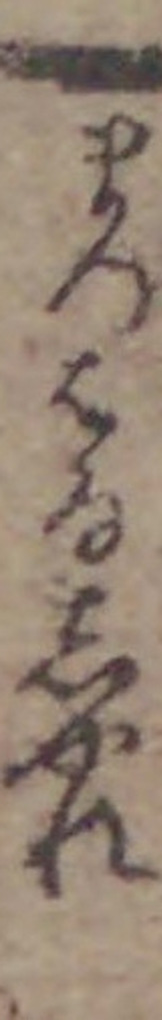まつはなしやれ
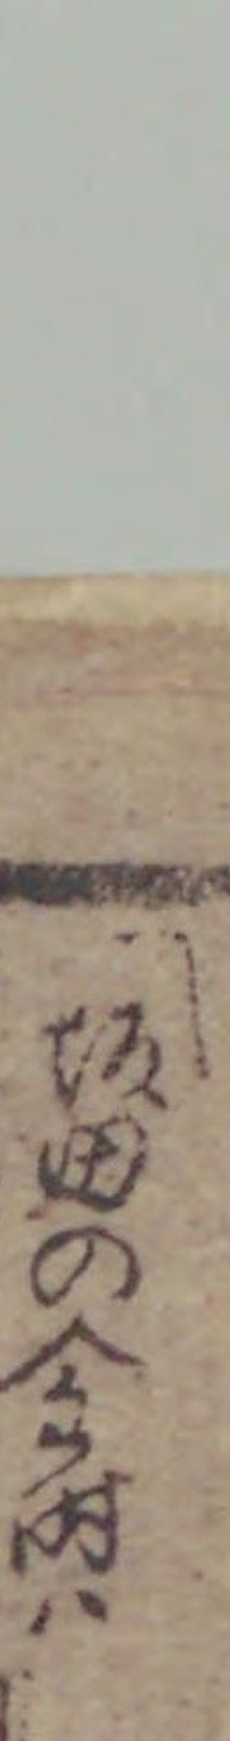〽坂田の金時は
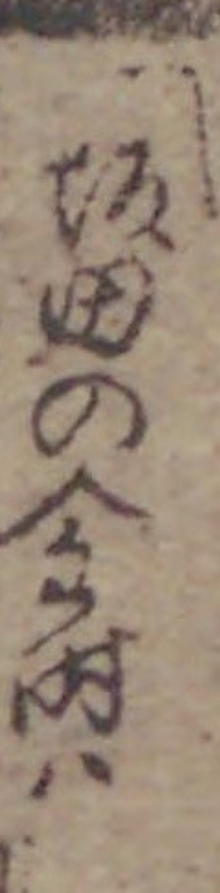〽坂田の金時は
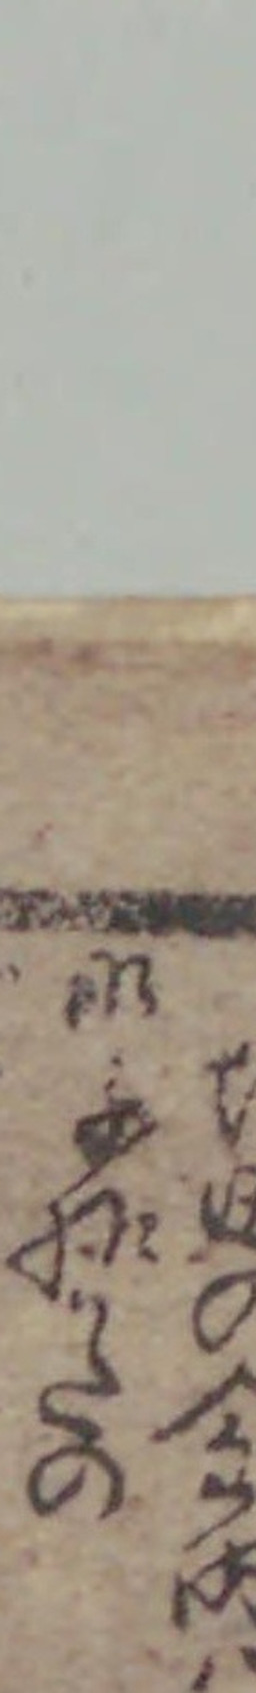御子様かたの
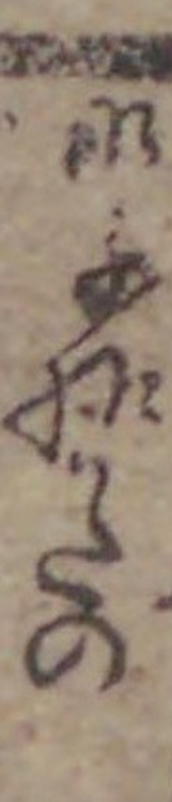御子様かたの
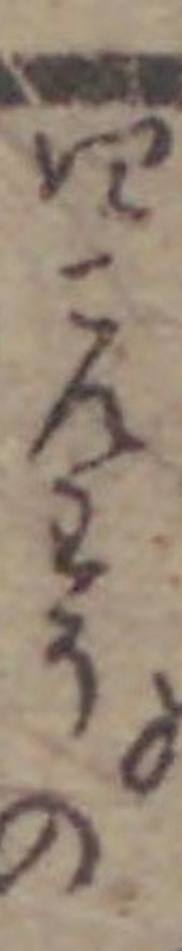四てんわうの
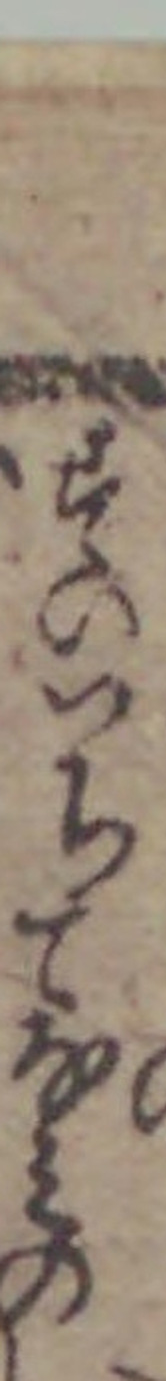すいいちてなみの
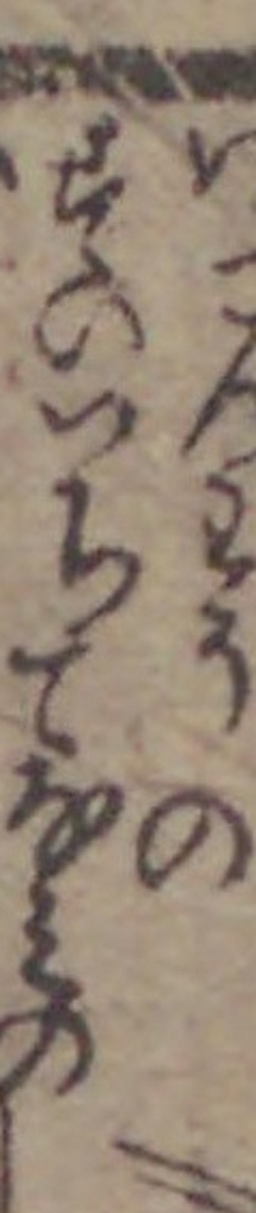すいいちてなみの
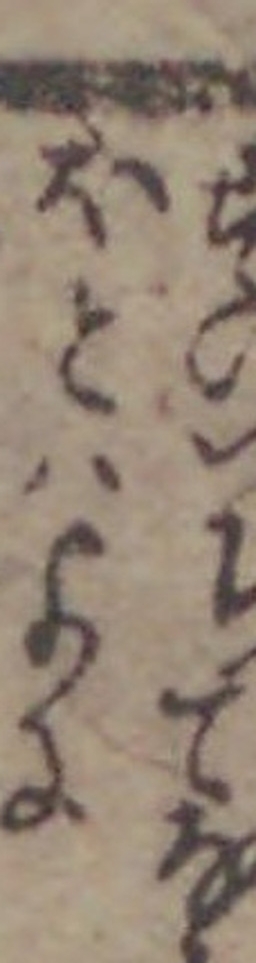ほとはよに
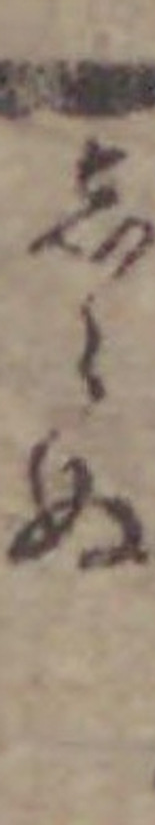しらぬ
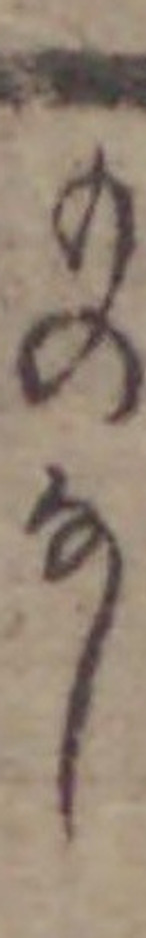ものなし
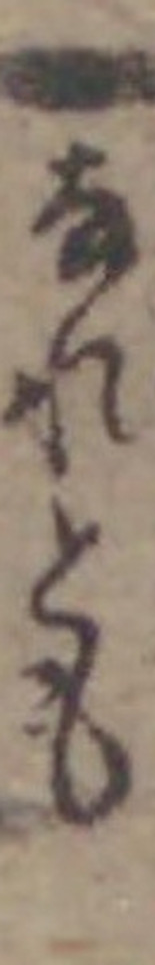なれとも
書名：化物鼻がひしげ 2巻
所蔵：国立国会図書館 National Diet Library, JAPAN
